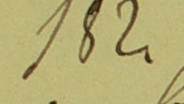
182
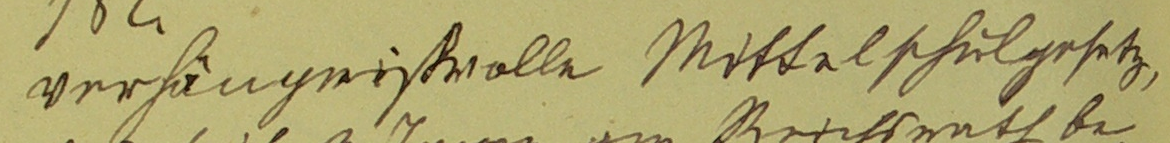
verhängnisvolle Mittelschulgesetz,
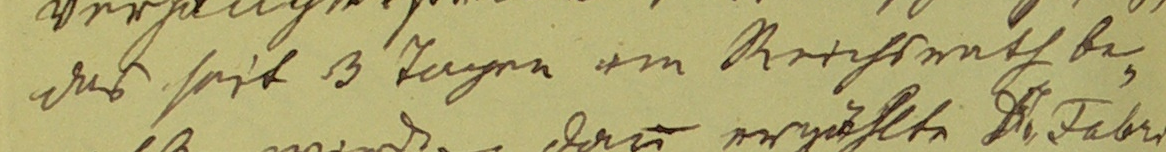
das seit 3 Tagen im Reichsrath be¬
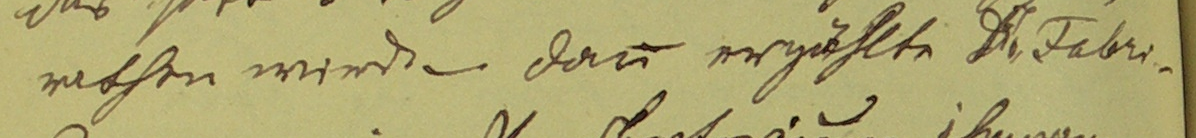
rathen wird,-- dann erzählte Dr. ???
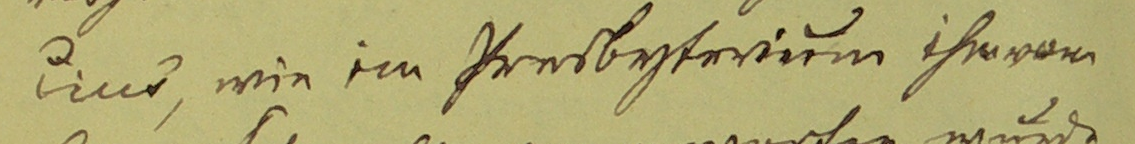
??? , wie im Presbyterium ihm von
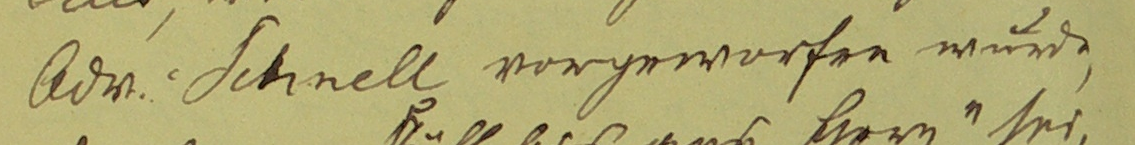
Adv. ??? vorgeworfen wurde,
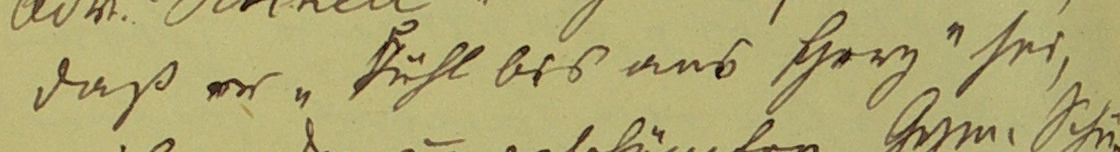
daß er „ kühl bis ans Herz“ sei,
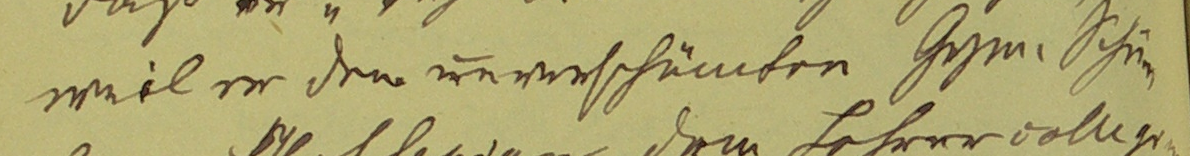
weil er den unverschämten Gym. Schü¬
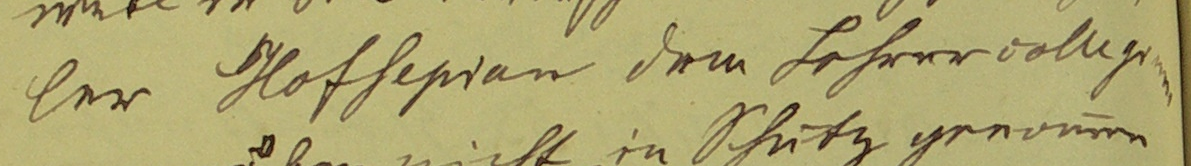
ler ??? dem Lehrerkollegi
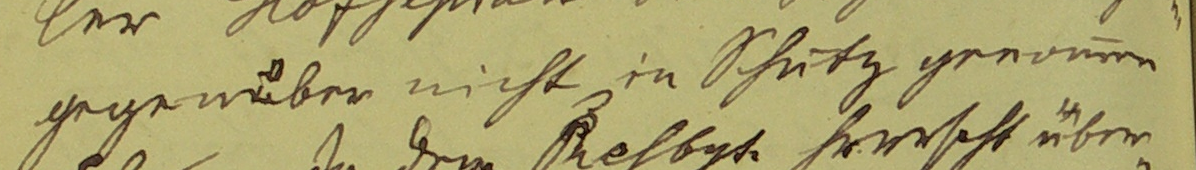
gegenüber nicht in Schutz genommen
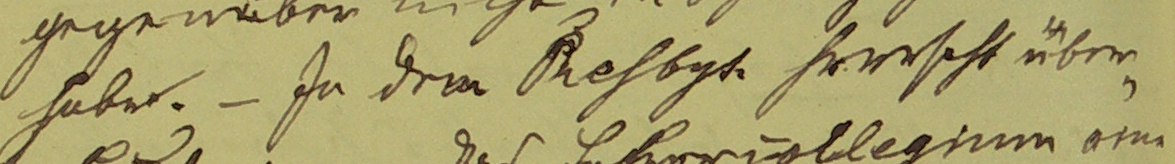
habe.- In dem Presbyt. herrscht über¬
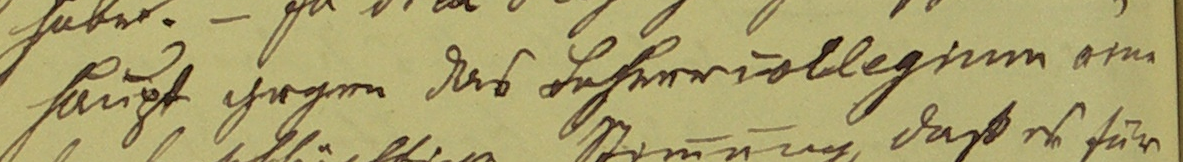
haupt gegen das Lehrer??? Eine
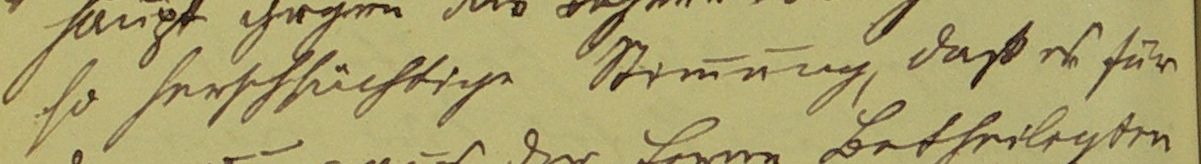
so herschsüchtige Stimmung, daß es für
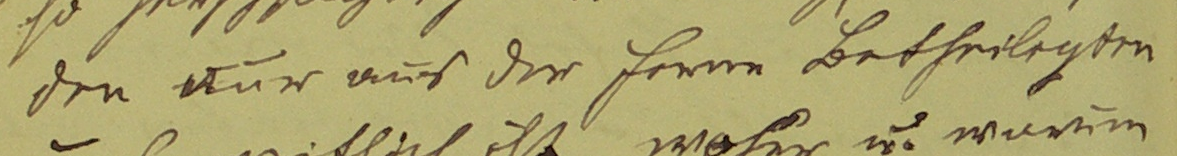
den nur aus der Ferne Betheiligten
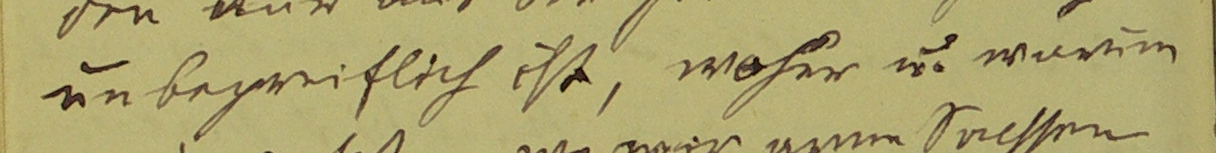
unbegreiflich ist, woher u. warum
